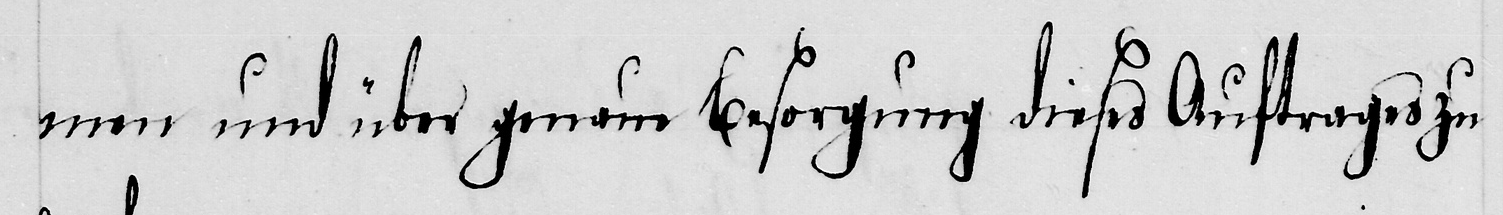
men und über genaue Besorgung dieses Auftrages zu
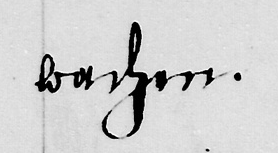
wachen.
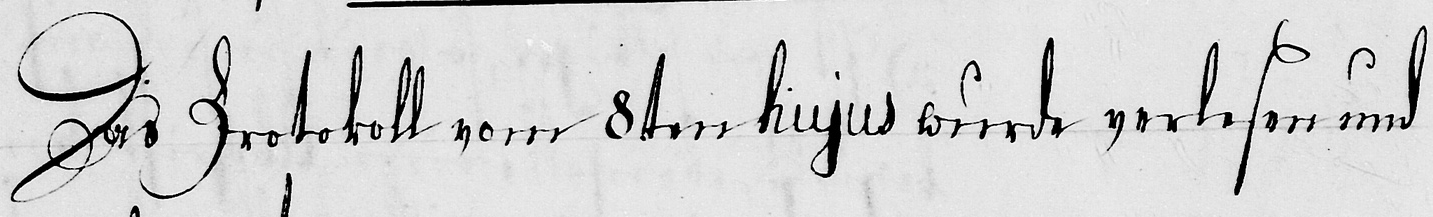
Das Protokoll vom 8ten hujus wurde verlesen und
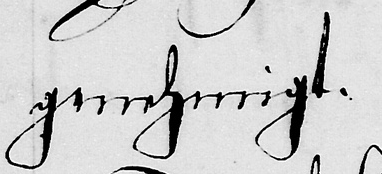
genehmigt.
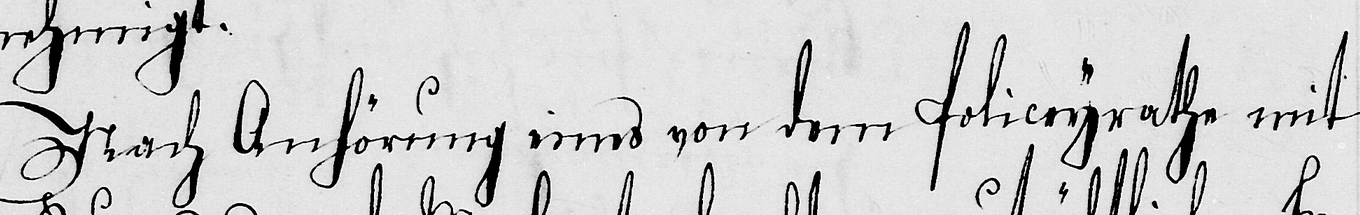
Nach Anhörung eines von dem Policeyrathe mit
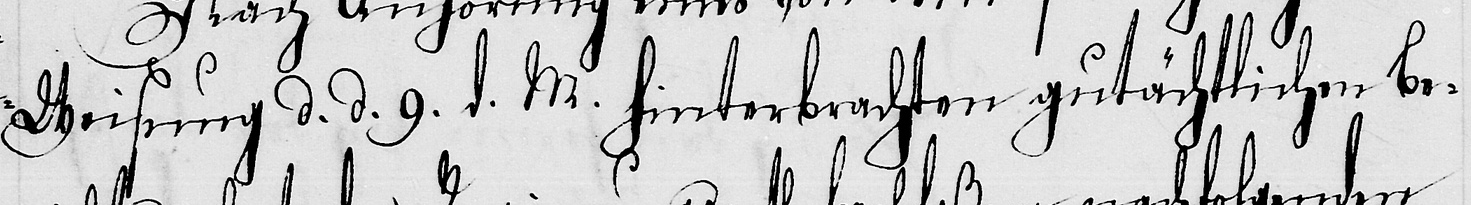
Weisung d. d. 9. d. M. hinterbrachten gutächtlichen Be¬
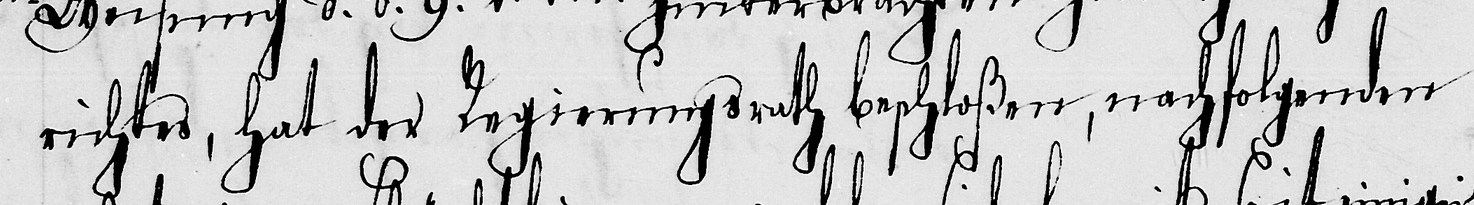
richtes, hat der Regierungsrath beschloßen, nachfolgenden
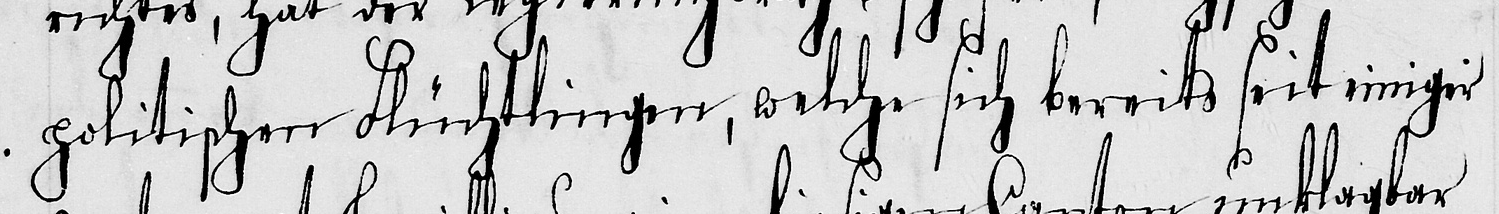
politischen Flüchtlingen, welche sich bereits seit einig¬
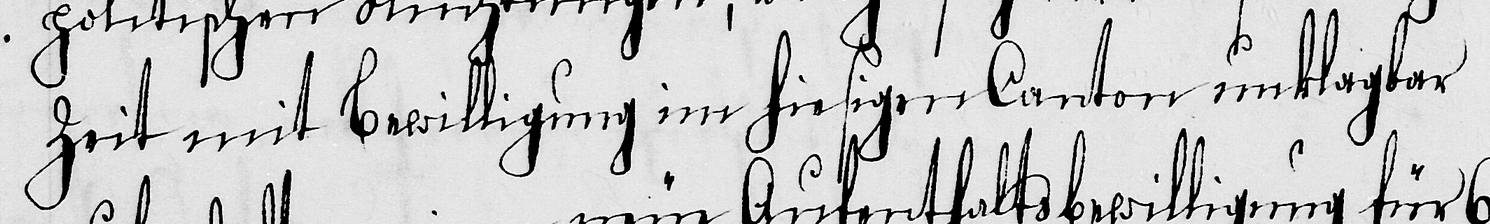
Zeit mit Bewilligung im hiesigen Canton unklagbar
